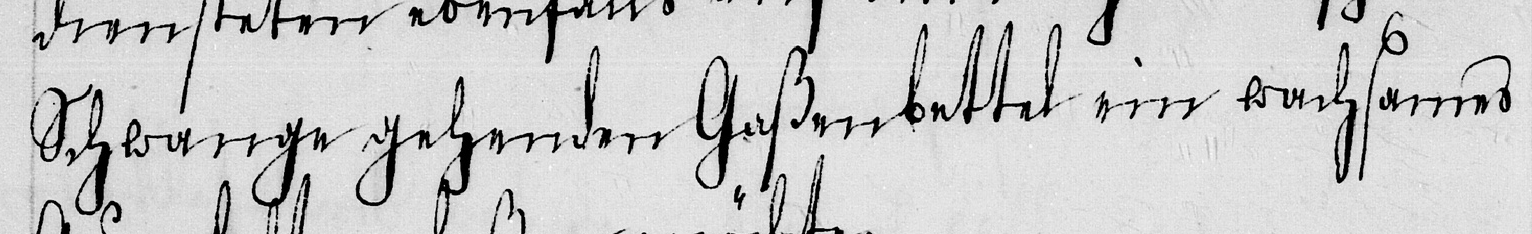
Schwange gehenden Gaßenbettel ein wachsames
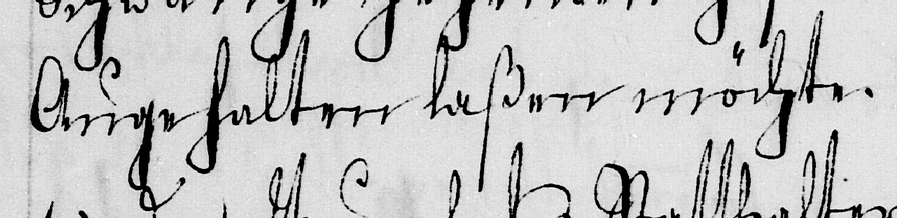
Auge halten laßen möchte.
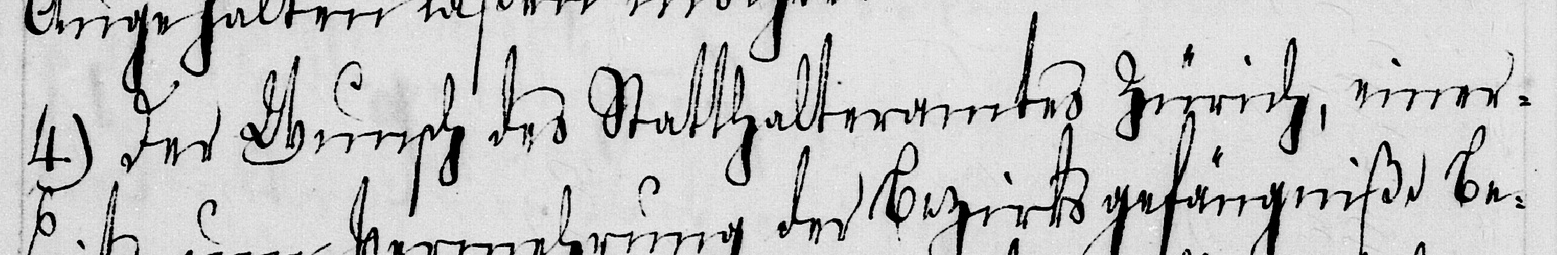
4.) Der Wunsch des Statthalteramtes Zürich, einer¬
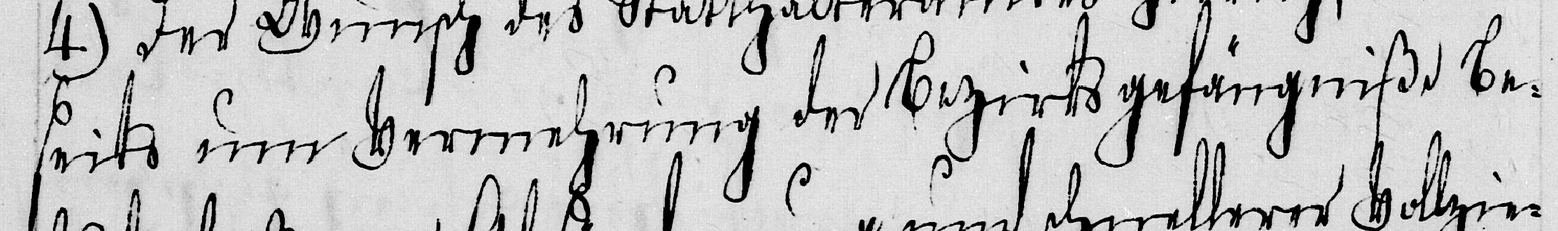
seits um Vermehrung der Bezirksgefängniße Be¬
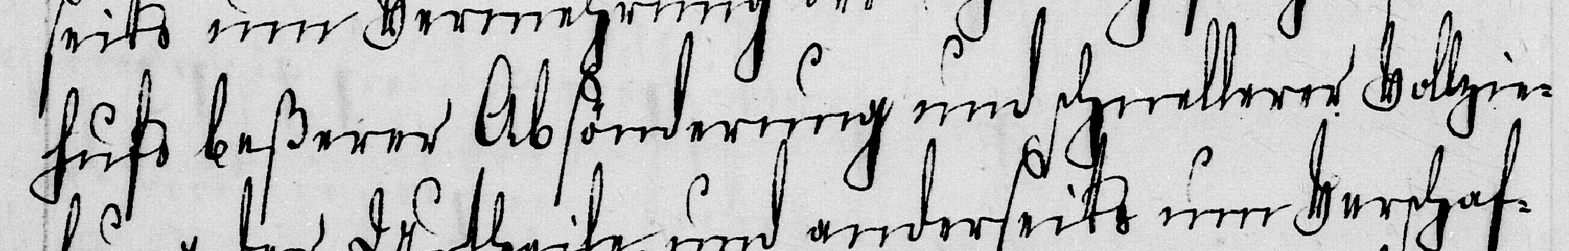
hufs beßerer Absönderung und schnellerer Vollzie¬
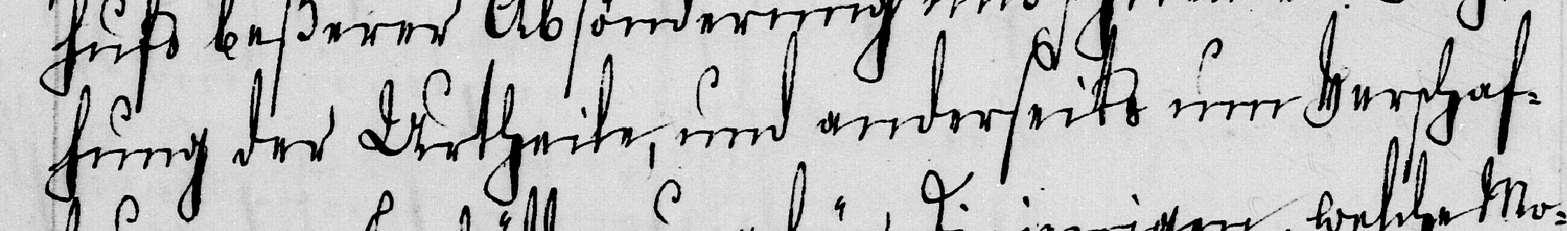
hung der Urtheile, und anderseits um Verschaf¬
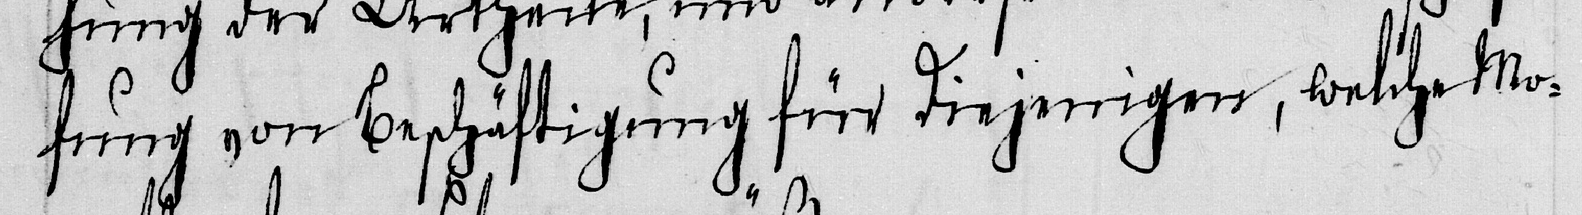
fung von Beschäftigung für Diejenigen, welche Mo¬
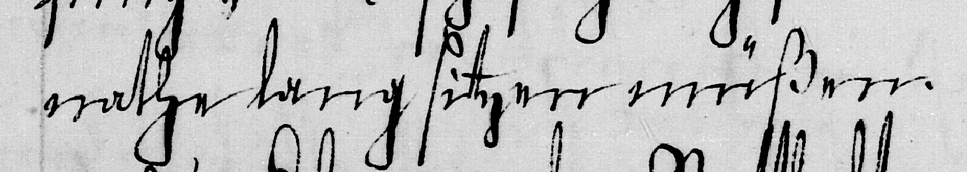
nathe lang sitzen müßen.
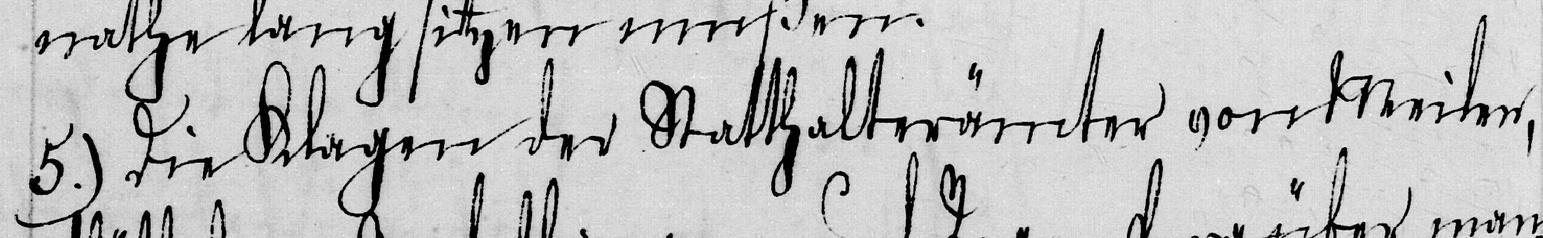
5.) Die Klagen der Statthalterämter von Meilen,
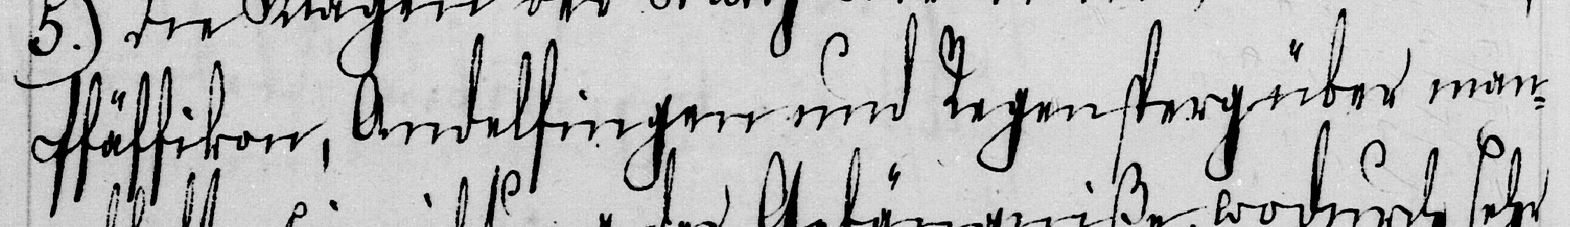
Pfäffikon, Andelfingen und Regensperg über man¬
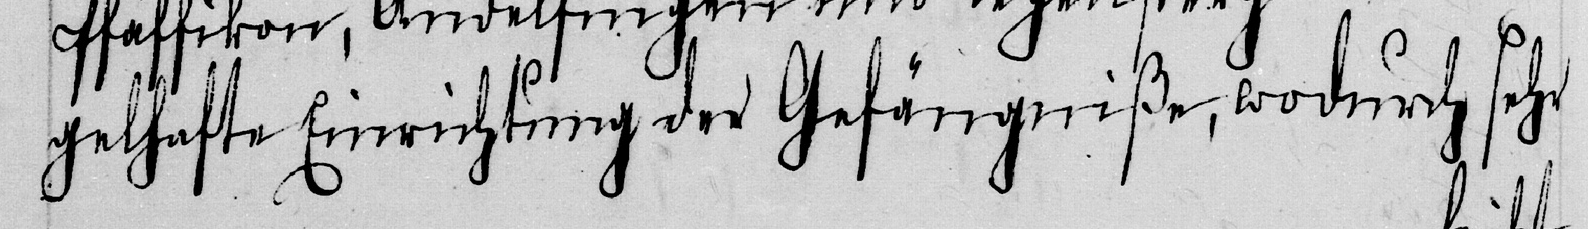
gelhafte Einrichtung der Gefängniße, wodurch sehr
